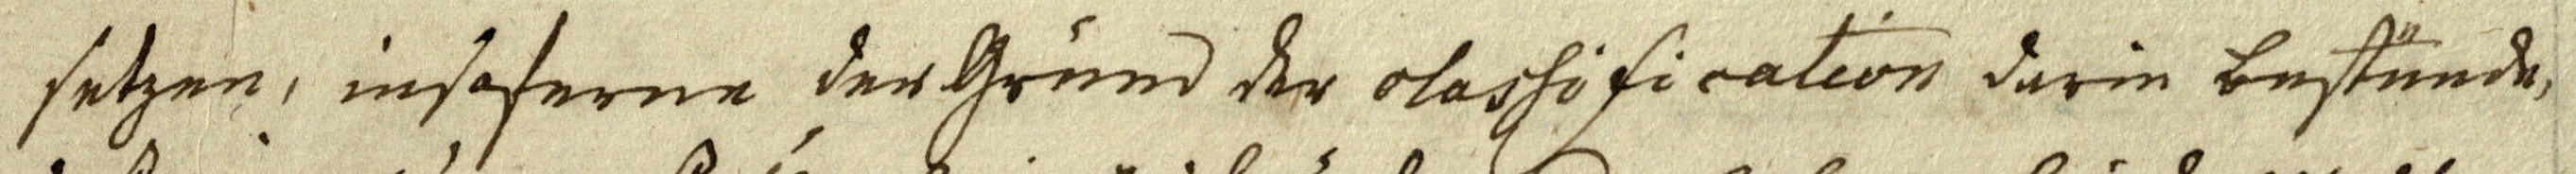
setzen, insoferne der Grund der classification darin bestünde,
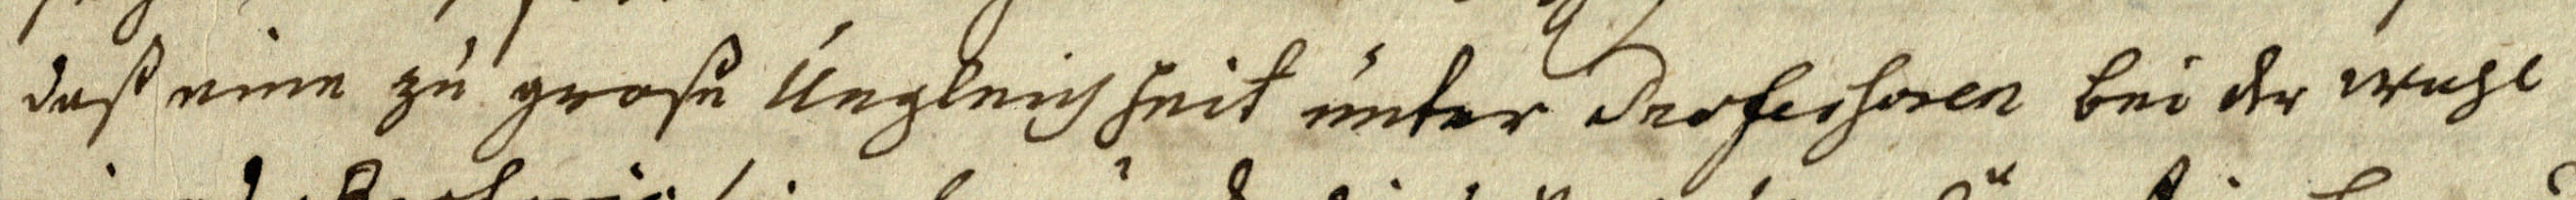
daß eine zu große Ungleichheit unter Professoren bei der Wahl
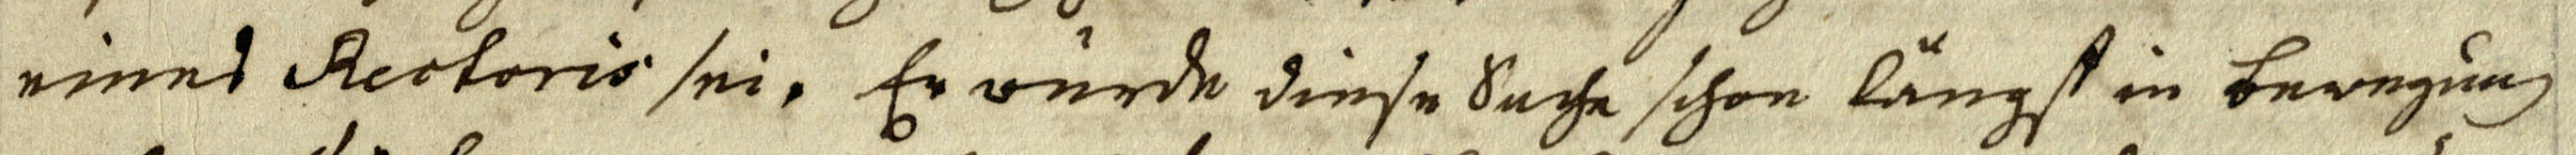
eines Rectoris sei. Er würde diese Sache schon längst in Bewegung
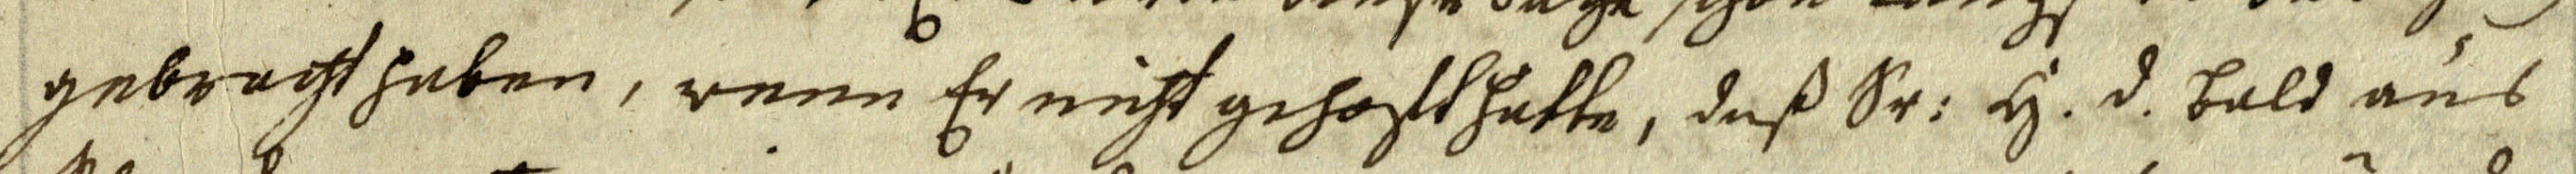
gebracht haben, wenn Er nicht gehoft hätte, daß Sr. H.d. bald aus
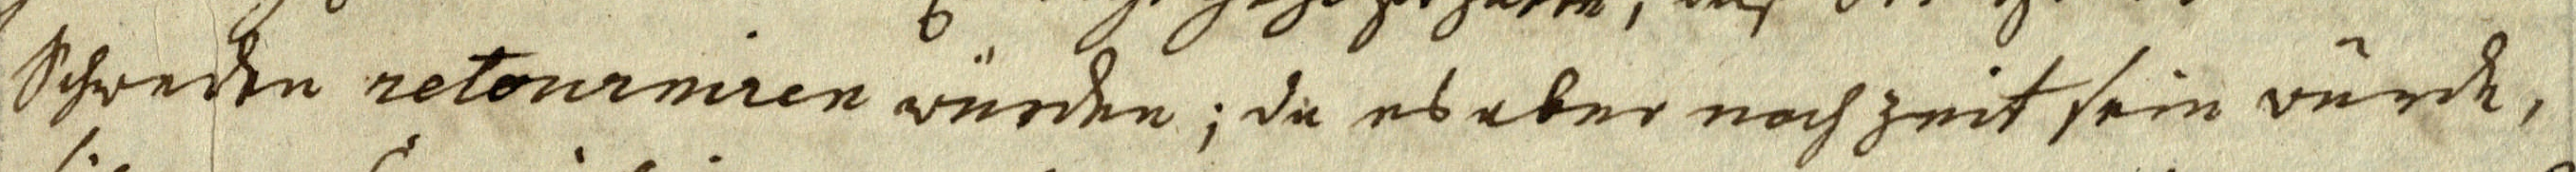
Schweden retourniren würden; da es aber noch Zeit sein würde,
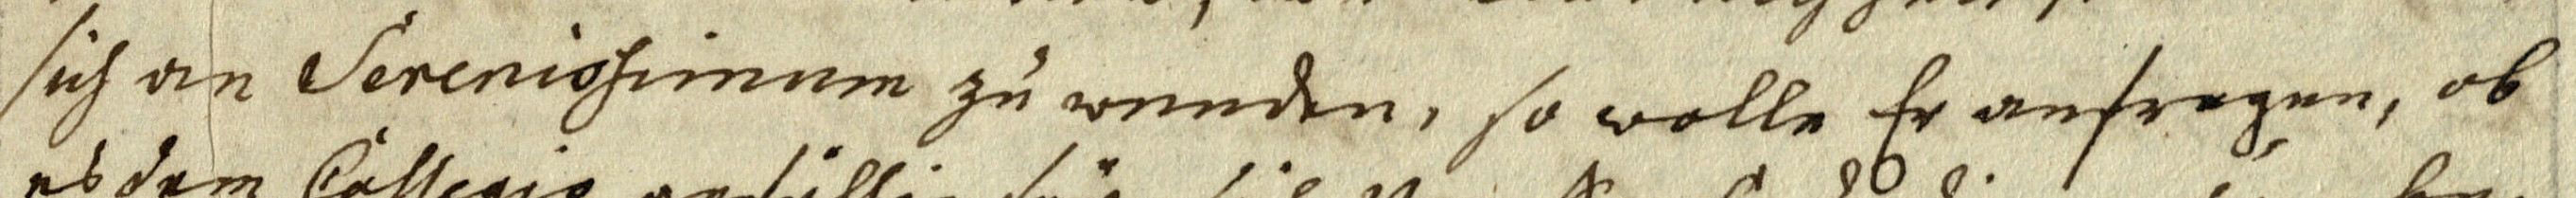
sich an Serenissimum zu wenden, so wolle Er anfragen, ob
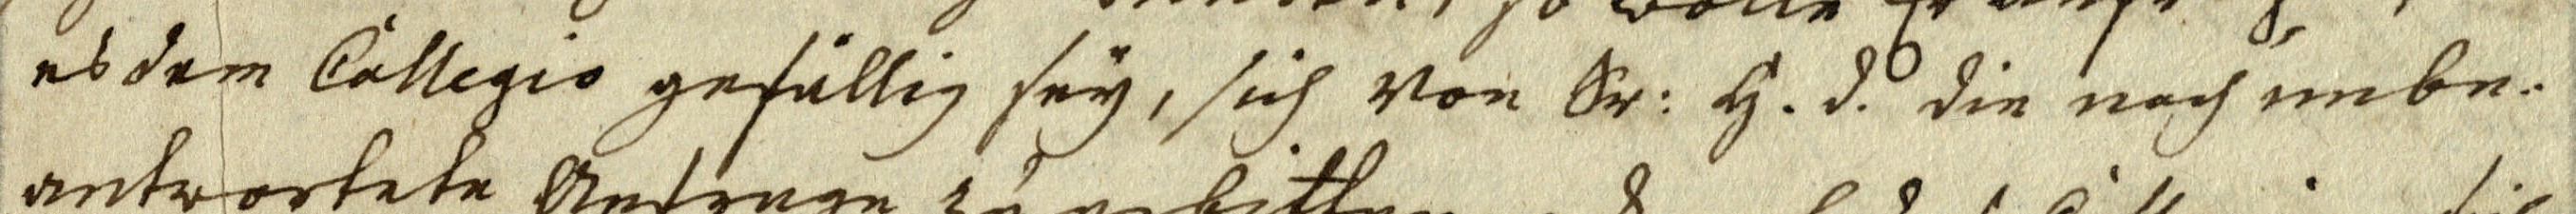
es dem Collegio gefällig seÿ, sich von Sr H. d. die noch unbe¬
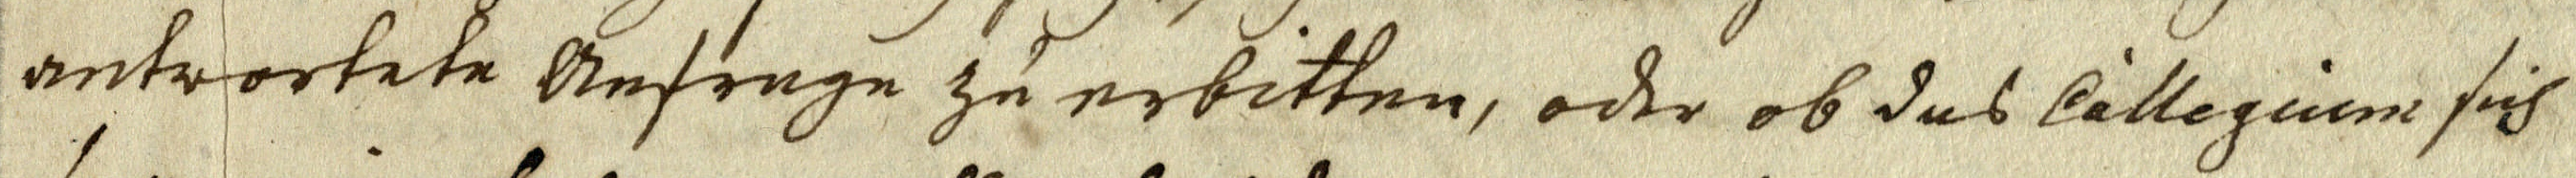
antwortete Nachfrage zu erbitten, oder ob das Collegium sich
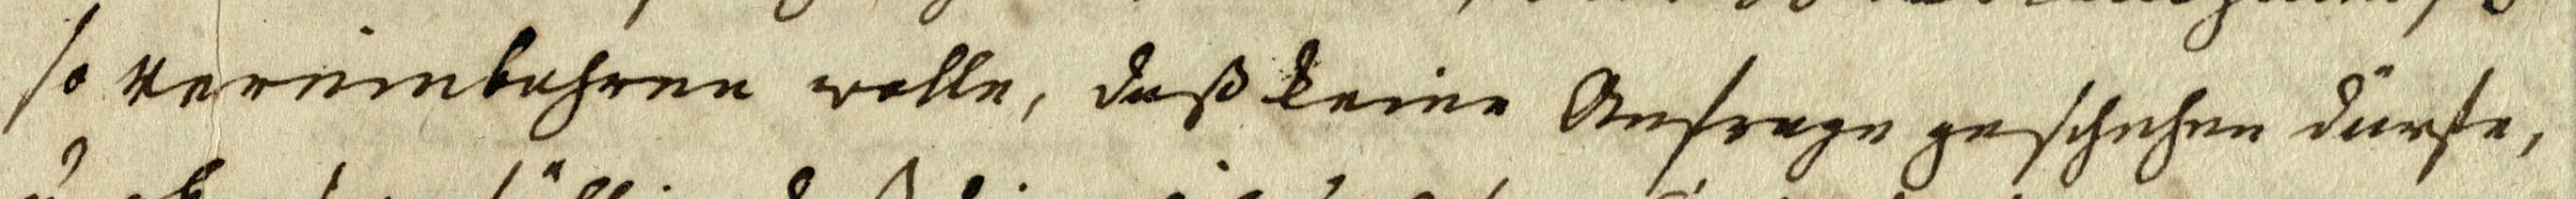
so vereinbahren wolle, daß keine Anfrage geschehen dürfe,
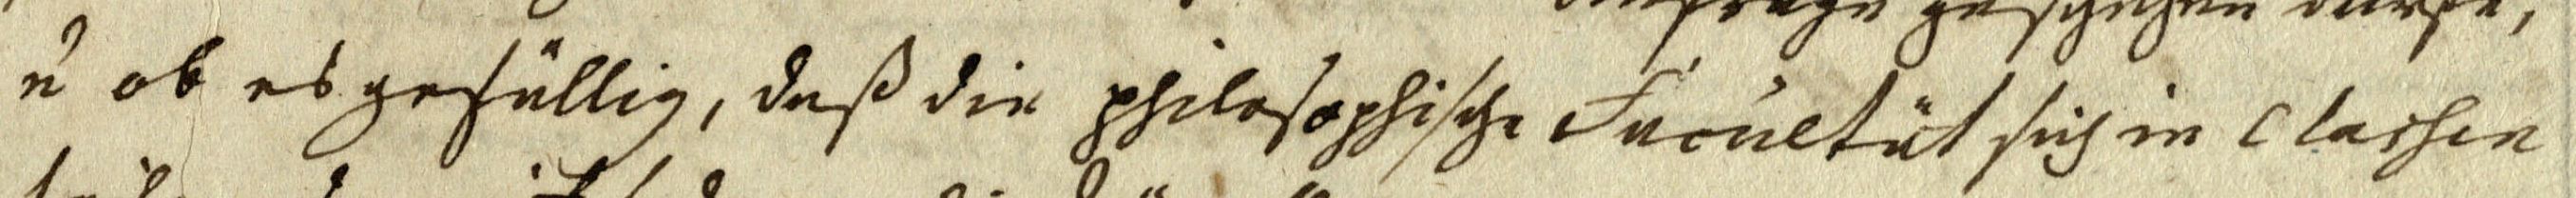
u ob es gefällig, daß die philosophische Facultät sich in Classen
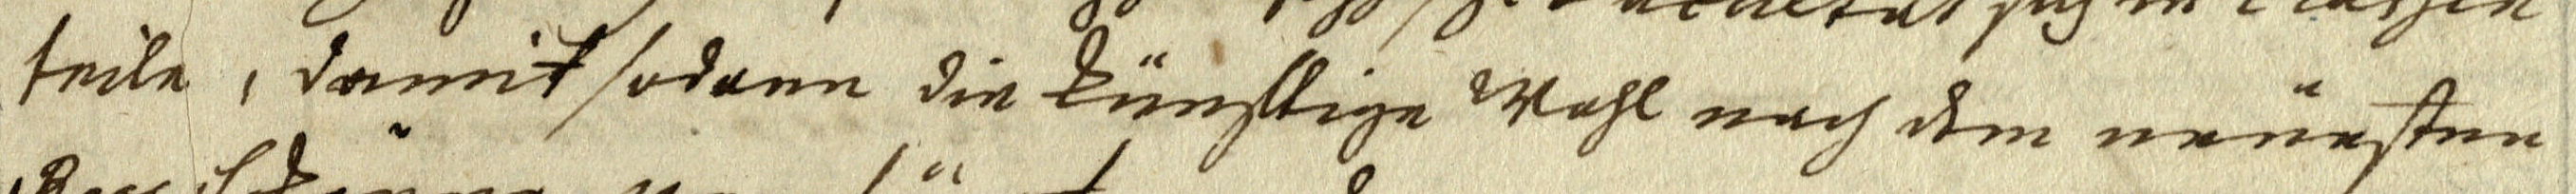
teile, damit sodann die künftige Wahl nach dem neuesten
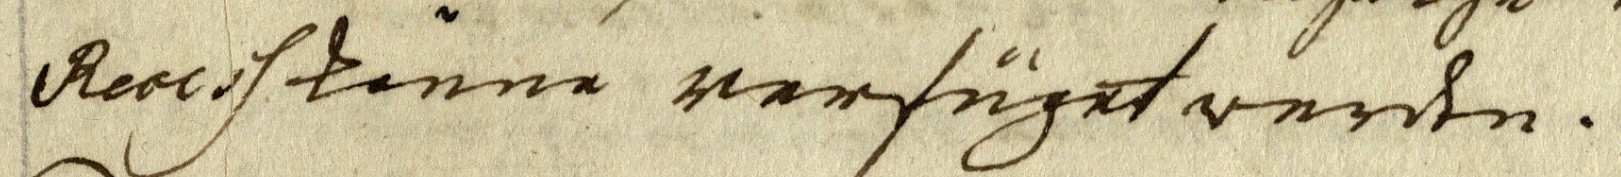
Receß könne verfüget werden.
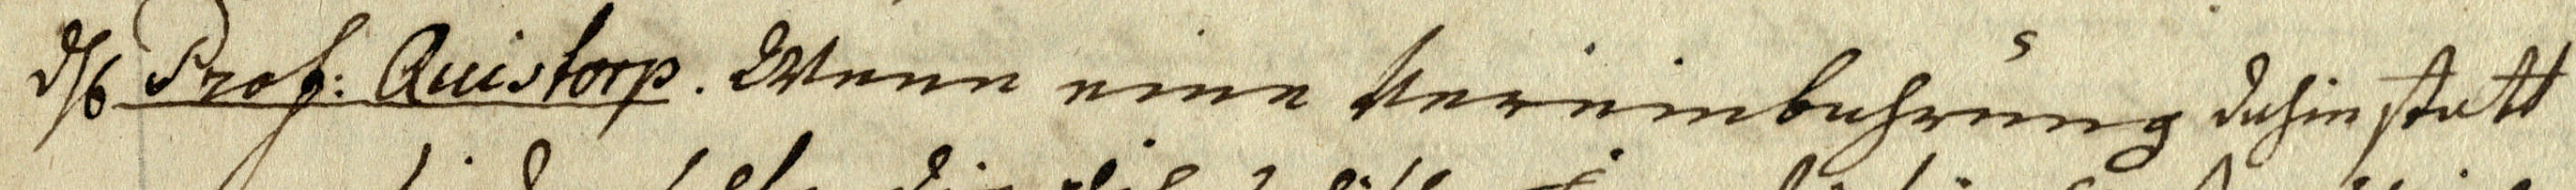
dh. Prof. Quistorp. Wenn eine Vereinbahrung dahin statt
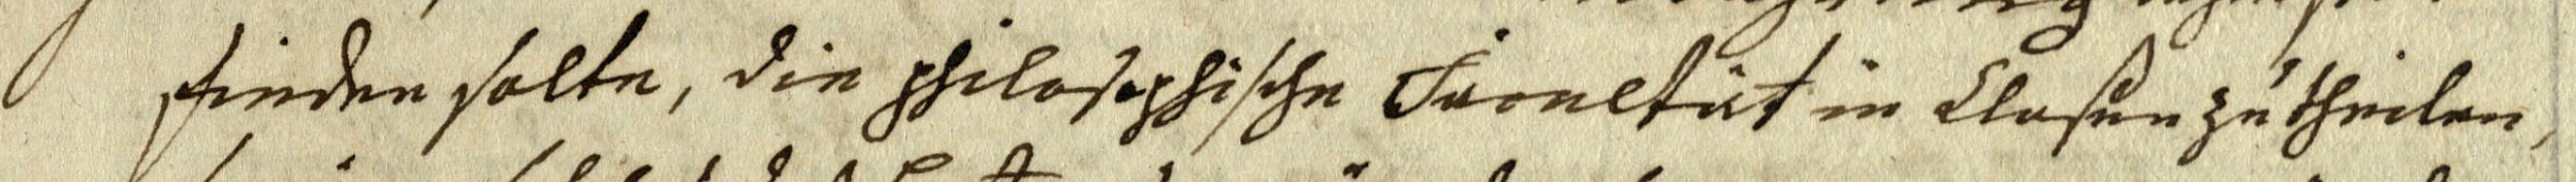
finden solte, die philosophische Facultät in Classen zu theilen
